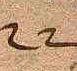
22
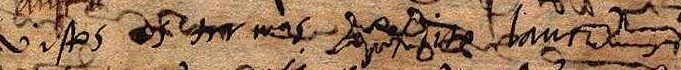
vistos os termos deste feito lançamos
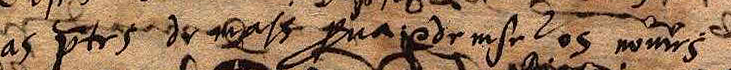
as p̄tes de majs ꝓua e demse os nomes
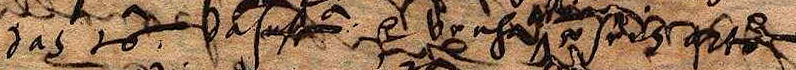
das tas da Justa. e venha c̄o seus artos
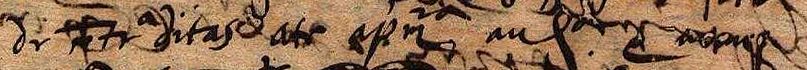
de c̄otraditas ate a pimra audja e nomee
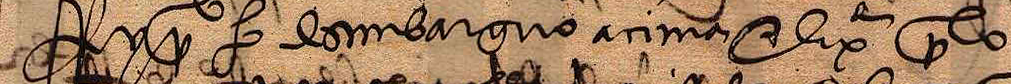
ffoy p̄do ho desembarguo acima ē lixa p̄lo
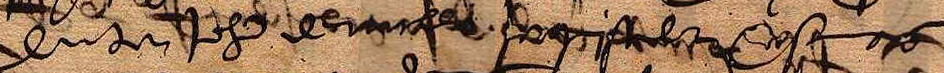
doutor Johā de mello Jnqujsidor ē suas
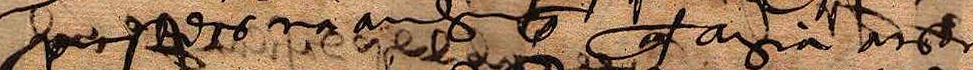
pousadas na audja q̄ fazia a este
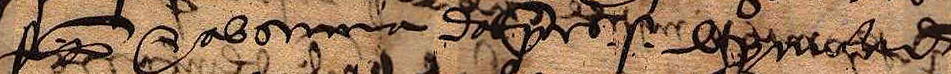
fc̄to ē absencia das p̄tes .s. do ꝓmotor da
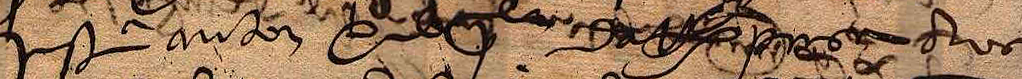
Justa autor e do p̄dor da Rꝭ presa Aos
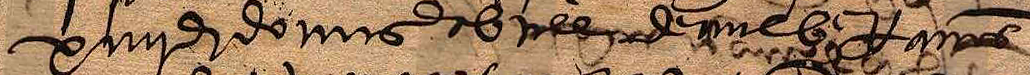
xiiij di do mes dabrill de mil bc R annos
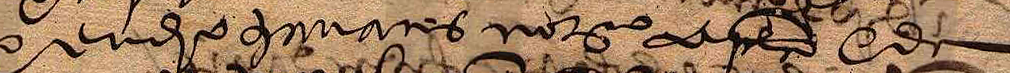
e eu djo trauaços notro ap̄lco e da
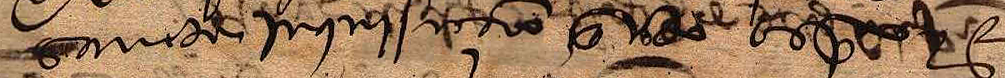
sancta Jnqujsição q̄ esto esp̄vy
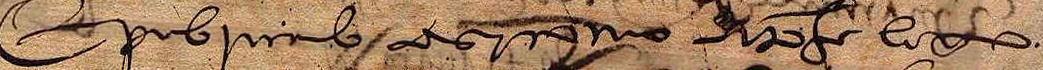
E pubricado asj como dito he logo
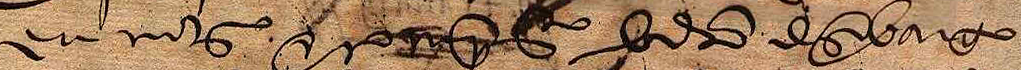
eu notro ē comp̄mto do dt̄o desēbargo
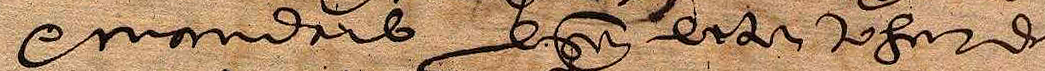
e mandado do s̄or doctor Johā de
